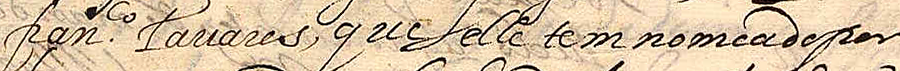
fran.co Tauares, que elle tem nomeado por
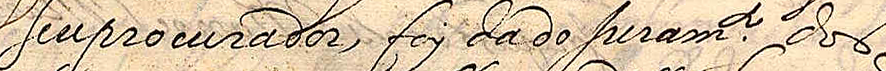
seu procurador, foy dado Juramto. dos
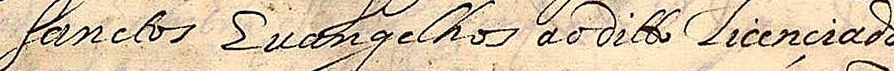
sanctos Euangelhos ao ditto Licençiado
